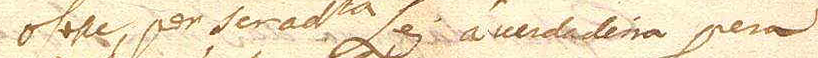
o fosse, por ser a dta Lej á uerdadeira pera
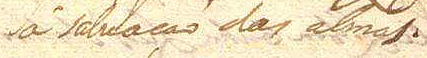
á saluaçaõ das almas.
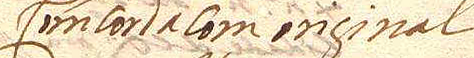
Comcorda com original
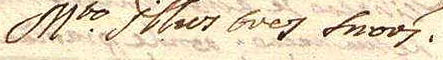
Mto. Illustres Snores̄.
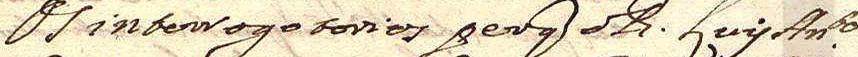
Os interrogatorios per q̄ o R. Luis Anto.
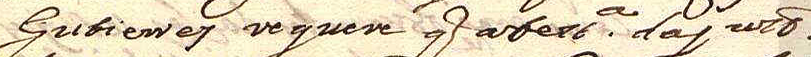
Gutierres requere q̄ a testa. da just.a
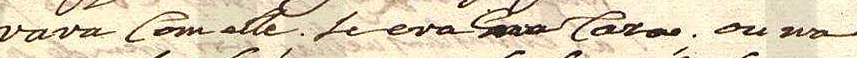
rava Com elle, se era Em Caza; ou na
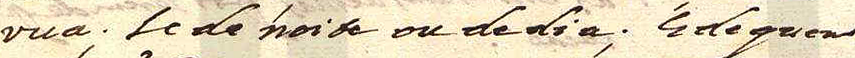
rua; se de noite ou de dia; E de quem
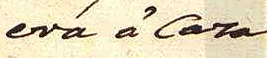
era á Caza
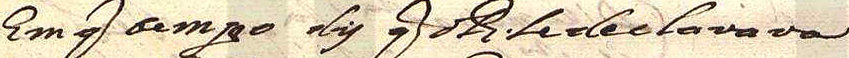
Em q̄ tempo dis q̄ o R. se declarava
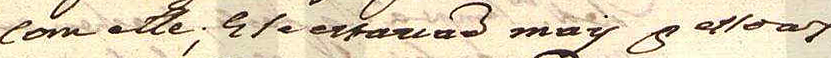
com elle; E se estauaõ mais pessoas
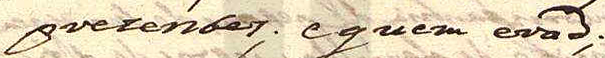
prezentes; e quem eraõ;
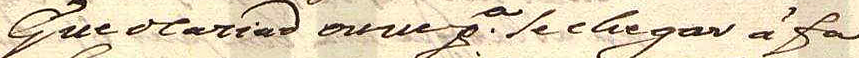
Que ocaziaõ ouue p.a se chegar á fa
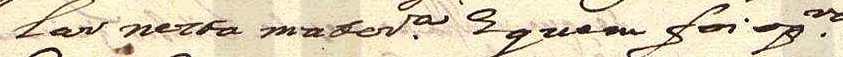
lar nesta mater.a E quem foi o pro.
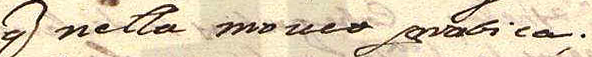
q̄ nella moueo pratica;
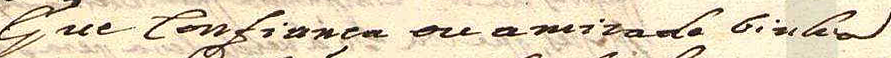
Que Confiança ou amizade tinha
